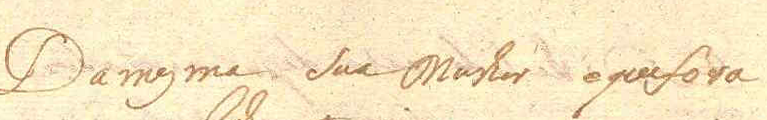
Da mesma sua Mulher e que fora
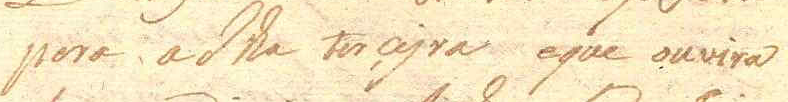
para a Ilha tercejra e que ouvira
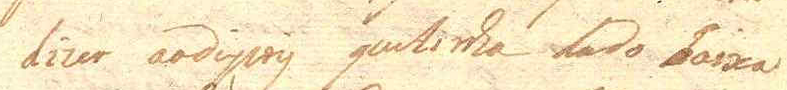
dizer ao dipois que tinha dado baixa
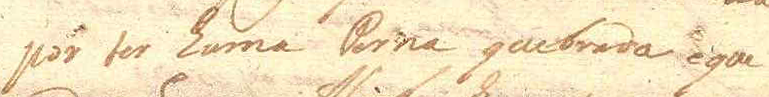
por ter huma Perna quebrada e que
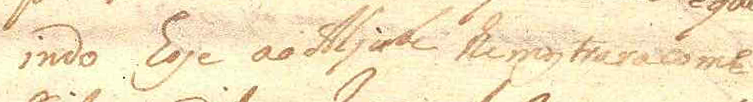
indo hoje ao Aljube lhe mostrara com e
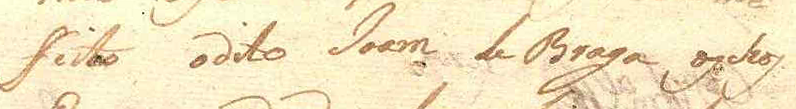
feito o dito Ioam de Braga os seos
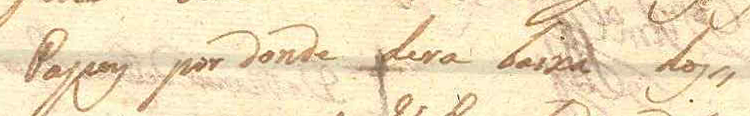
Papeis por donde dera baixa dos
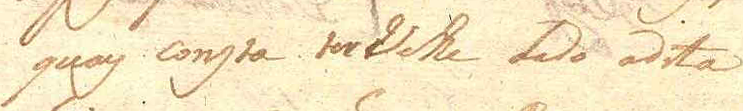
quais consta ter selhe dado a dita
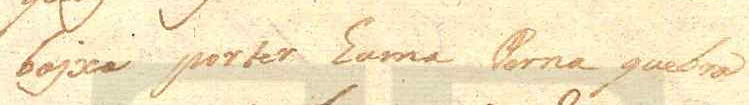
bajxa por ter huma Perna quebra
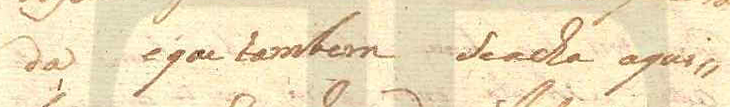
da e que tambem se acha aqui
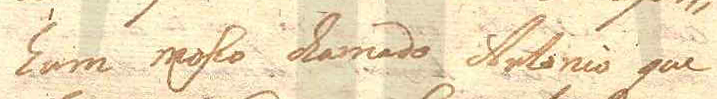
hum mosso chamado Antonio que
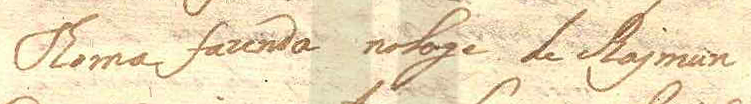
Thoma fazenda no Loge de Rajmun
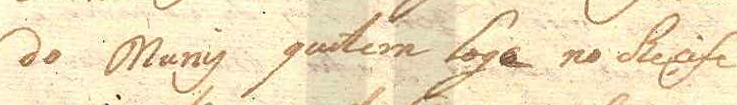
do Munis que tem loge no Recife
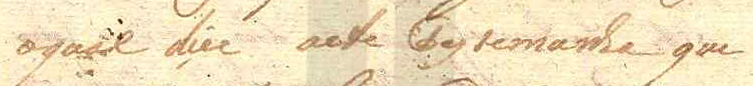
o qual dice a este Testemunha que
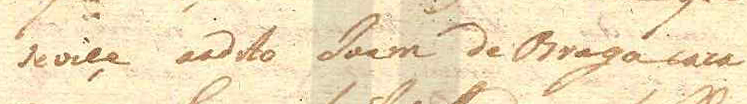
se vice ao dito Ioam de Braga caza
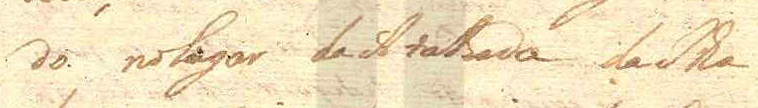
do. no lugar da Atalhada da Ilha
